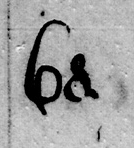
Be¬
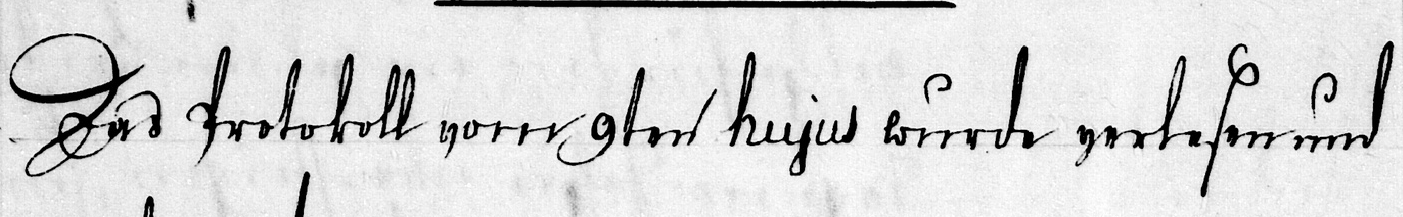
Das Protokoll vom 9ten hujus wurde verlesen und
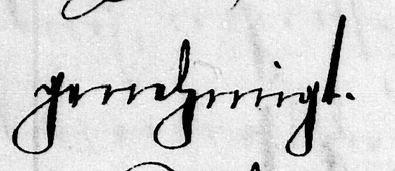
genehmigt.
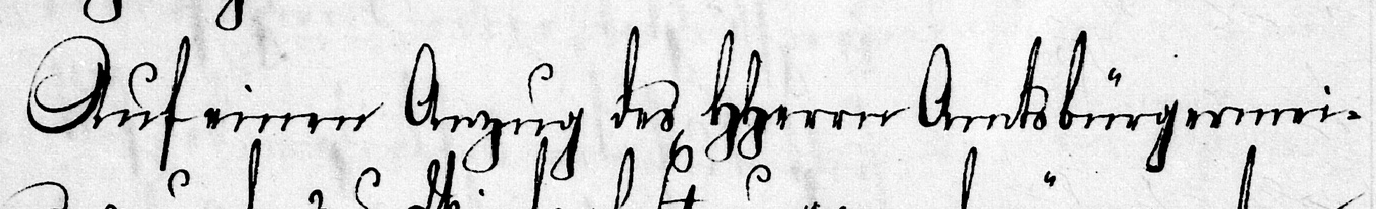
Auf einen Anzug des HHerrn Amtsbürgermei¬
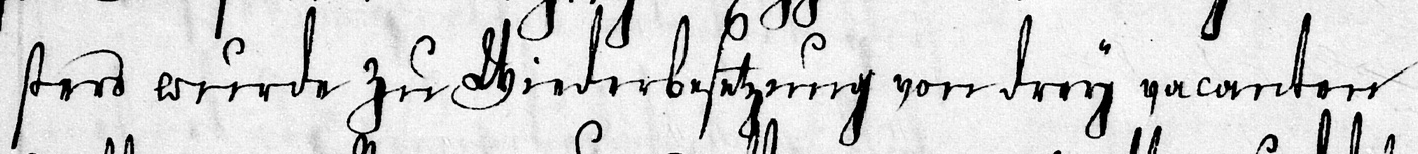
sters wurde zu Wiederbesetzung von drey vacanten
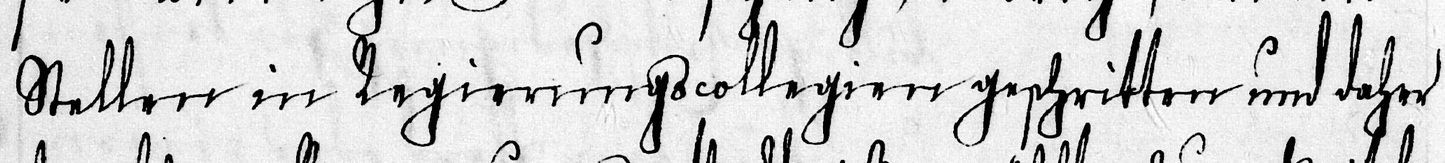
Stellen in Regierungscollegien geschritten und daher
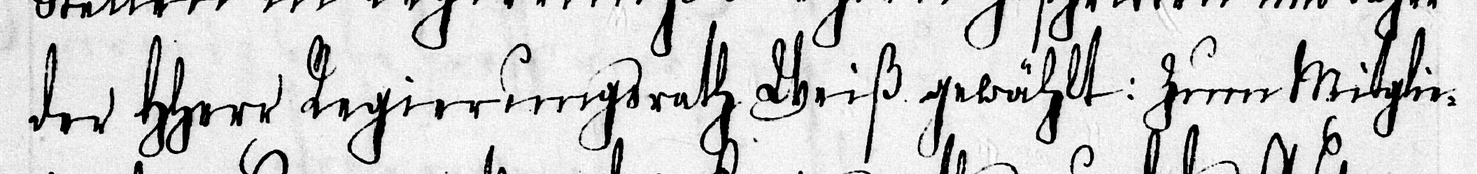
der HHerr Regierungsrath Weiß gewählt: zum Mitglie¬
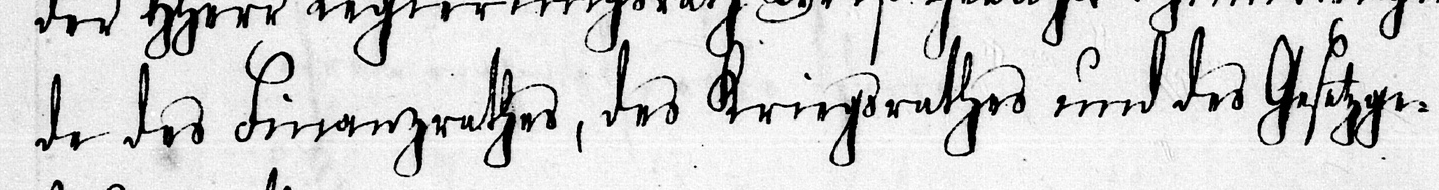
de des Finanzrathes, des Kriegsrathes und des Gesetzg¬
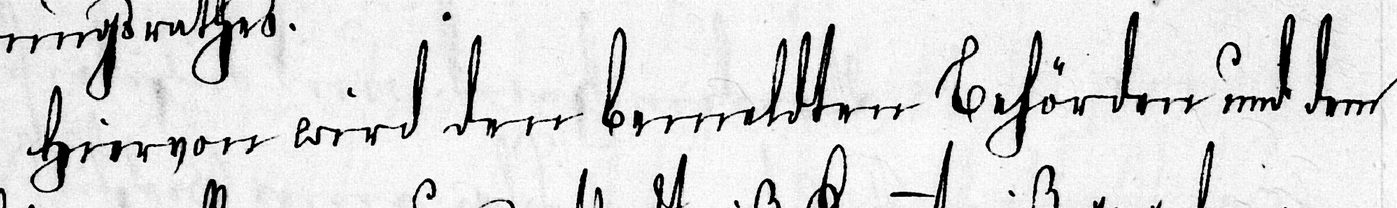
Hiervon wird den bemeldten Behörden und dem
